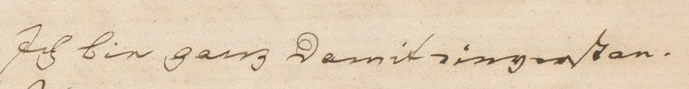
Ich bin ganz damit einverstand-
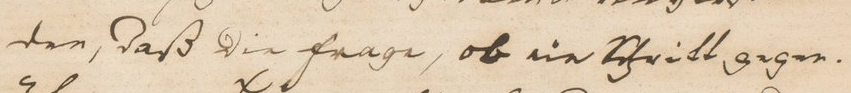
den, daß die Frage, ob ein Schrift gegen-
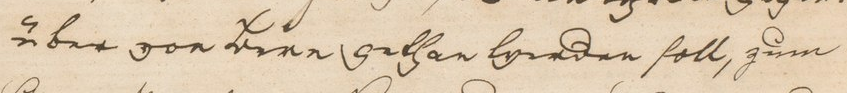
über von Bern gethan werden soll, zum
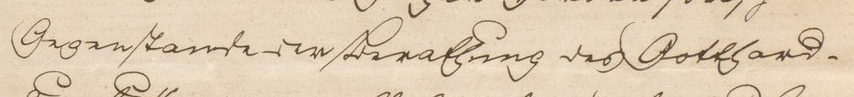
Gegenstande der Berathung des Gotthard -
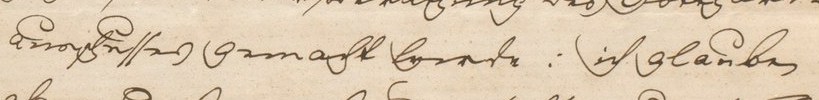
ausschusses gemacht werde: ich glaube
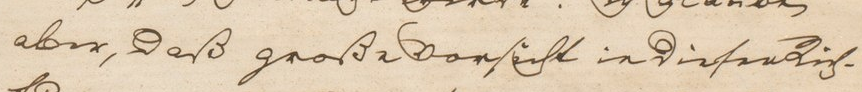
aber, daß große Vorsicht in dieser Rich-
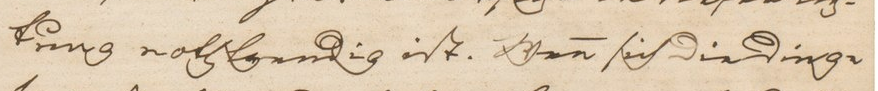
tung nothwendig ist. Wenn sich die Dinge
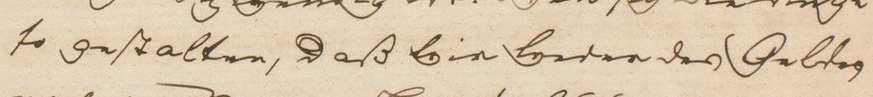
so gestalten, daß wir weder des Geldes
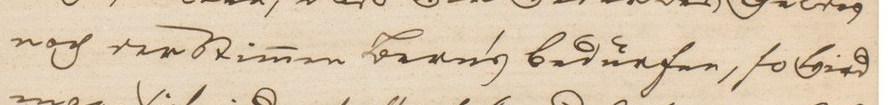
noch der Stimmen Bern's bedürfen, so wird
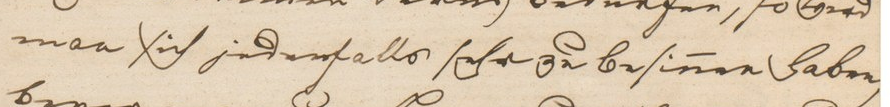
man sich jedenfalls sehr zu besinnen haben,
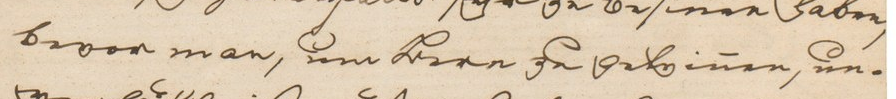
bevor man, um Bern zu gewinnen, un-
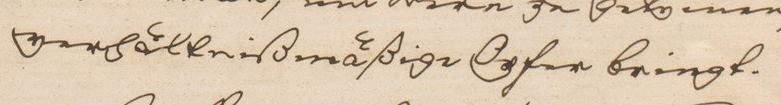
verhältnißmäßige Opfer bringt.
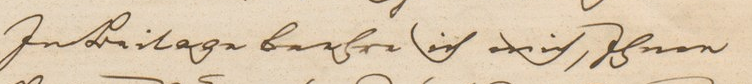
In Beilage beehre ich mich, Ihnen
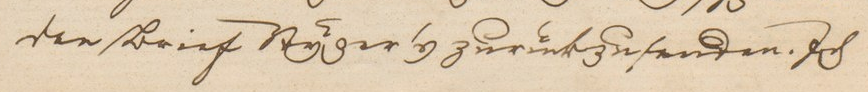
den Brief Styger's zurückzusenden. Ich
